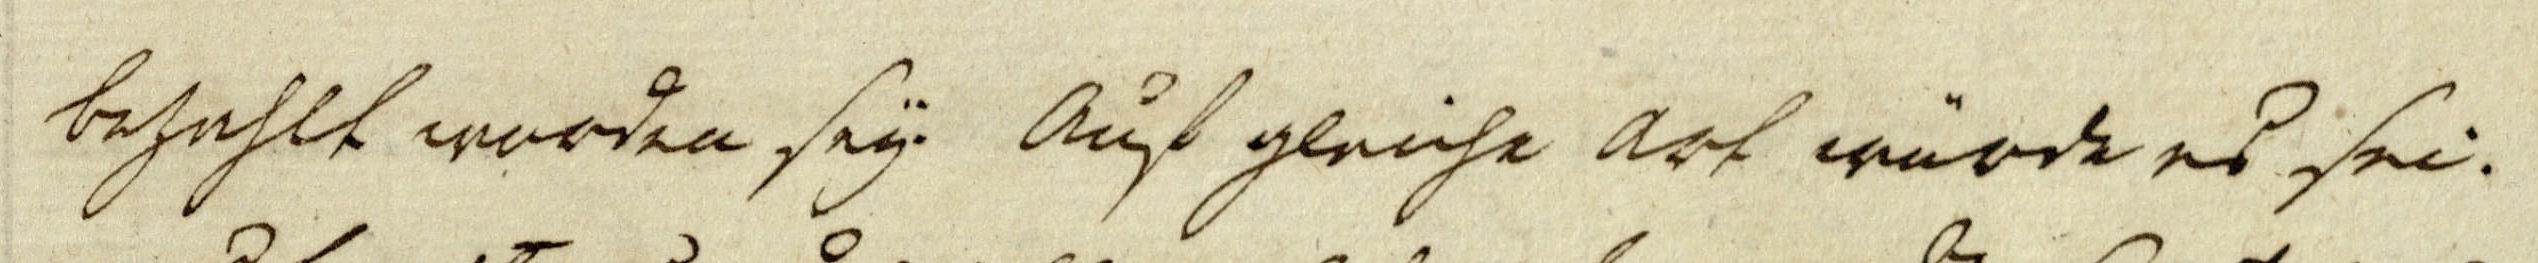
bezahlt worden seÿ. Auf gleiche Art würde es sei¬
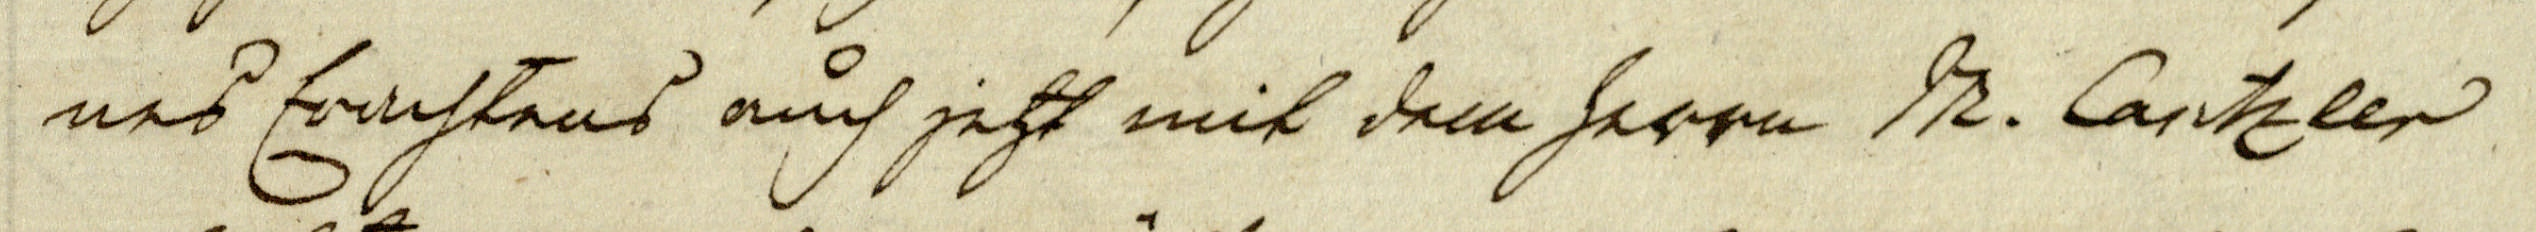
nes Erachtens auch jetzt mit dem Herrn M. Cantzler
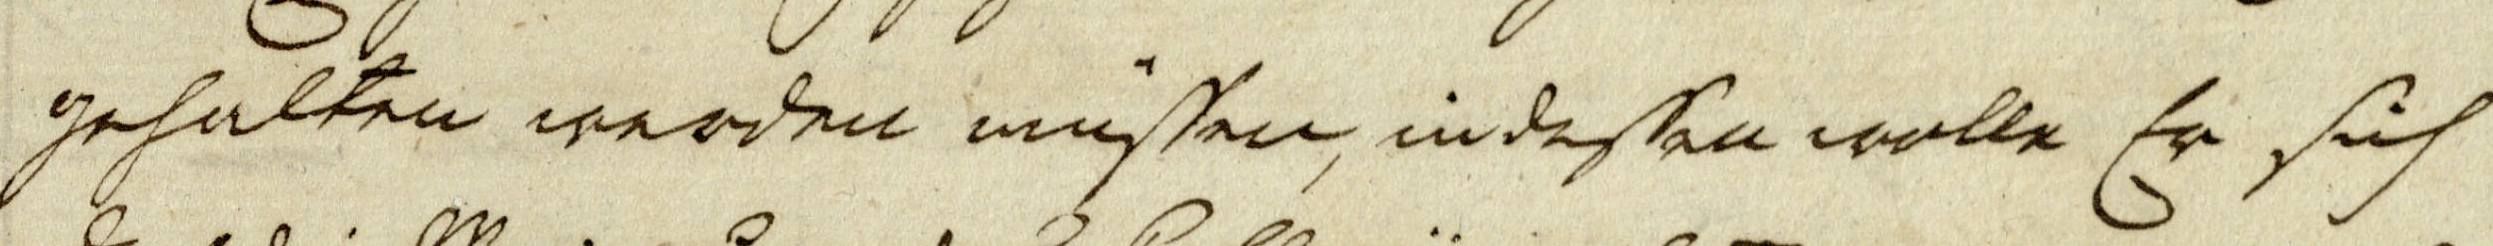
gehalten werden müssen, indessen wolle Er sich
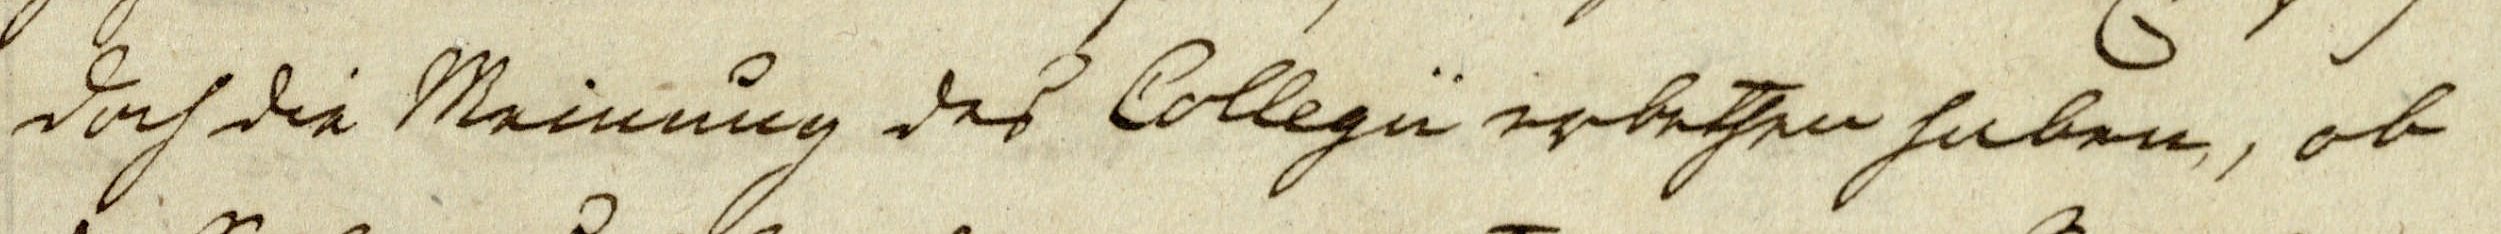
doch die Meinung des Collegii erbethen haben, ob
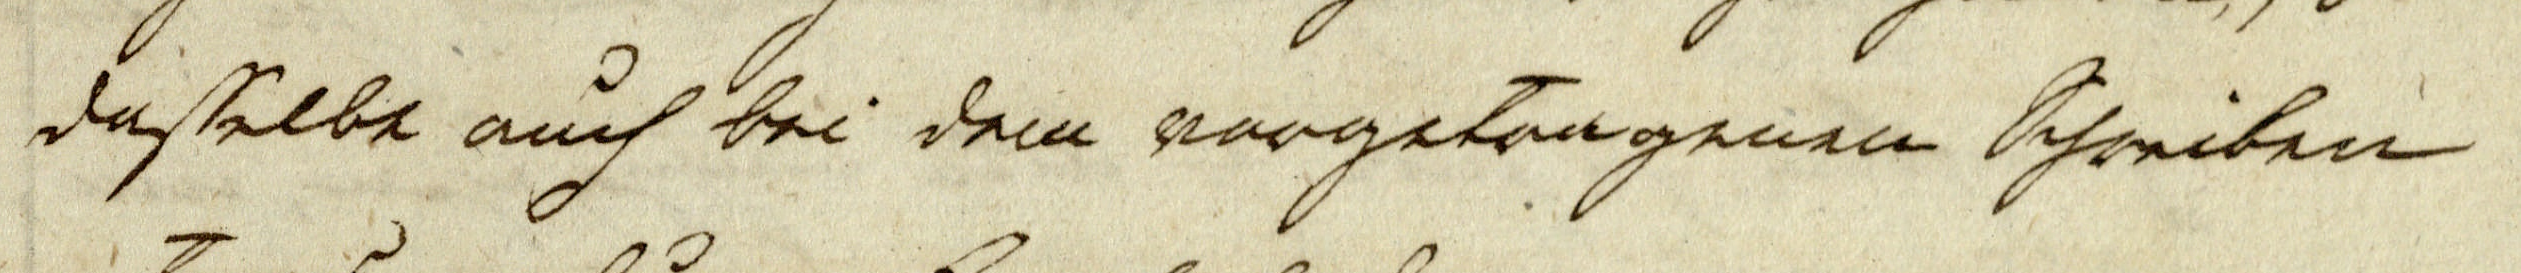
dasselbe auch bei dem vorgetragenen Schreiben
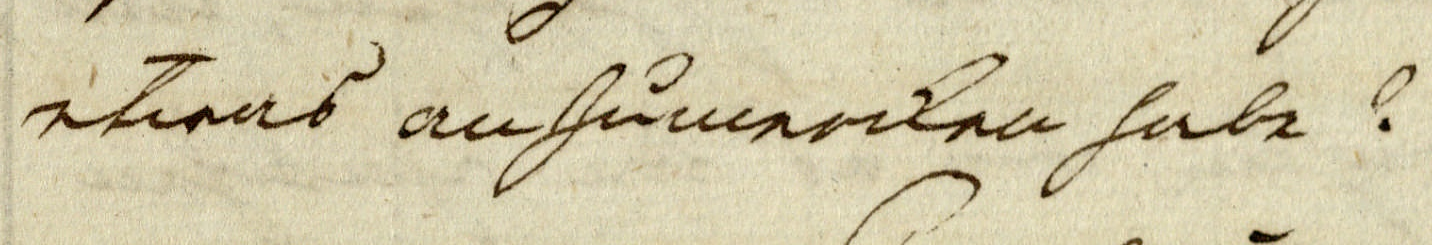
etwas anzumerken habe?
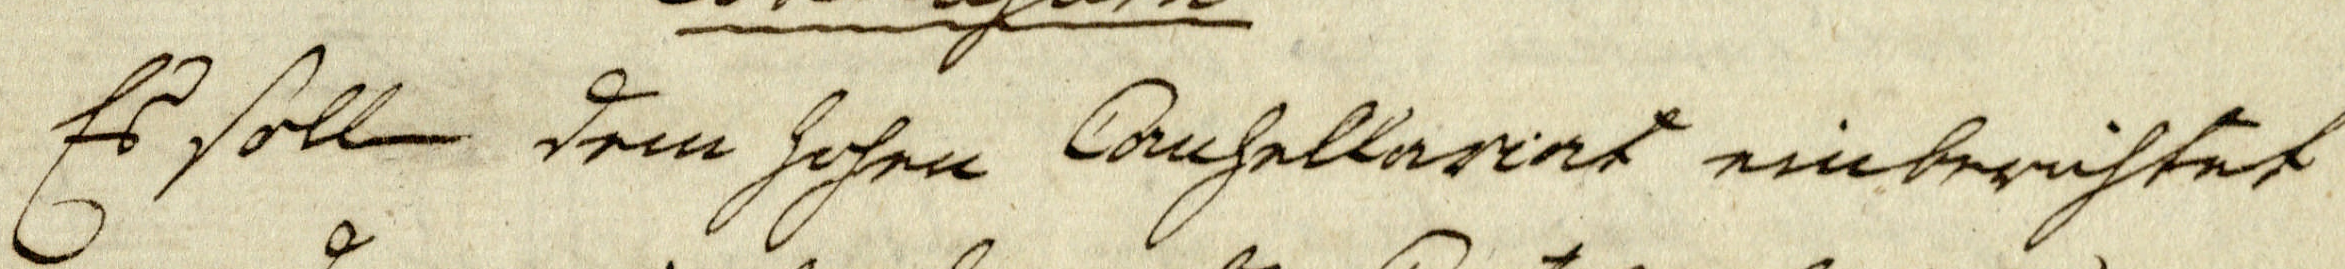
Es solle dem hohen Canzellariat einberichtet
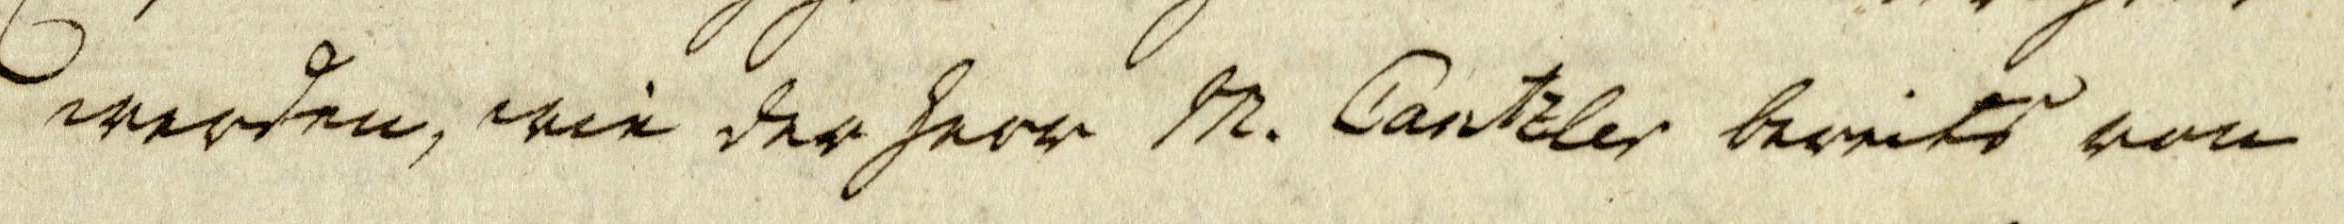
werden, wie der Herr M. Cantzler bereits von
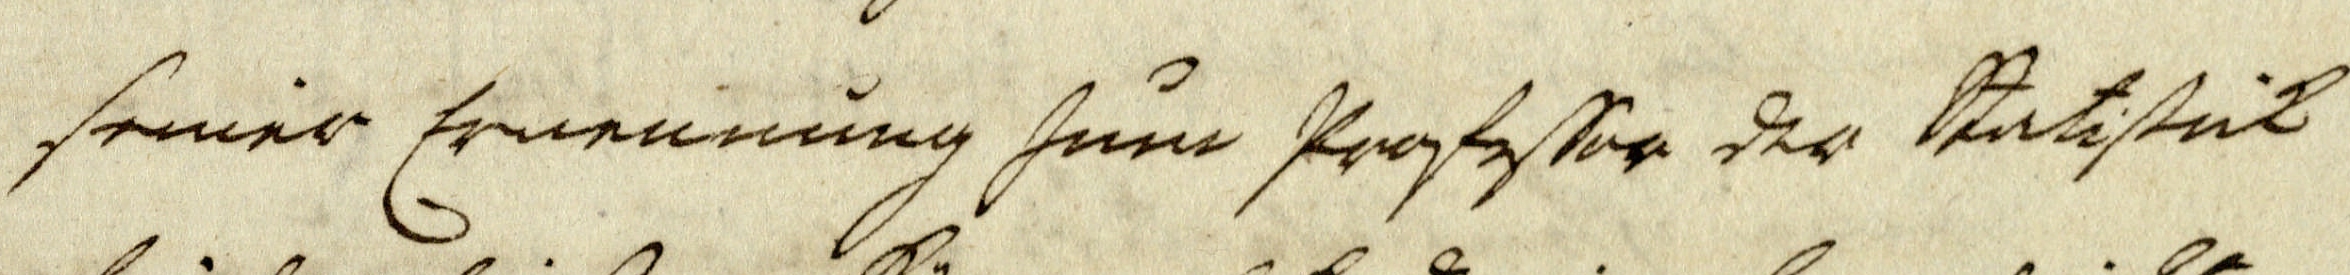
seiner Ernennung zum Professor der Statistick
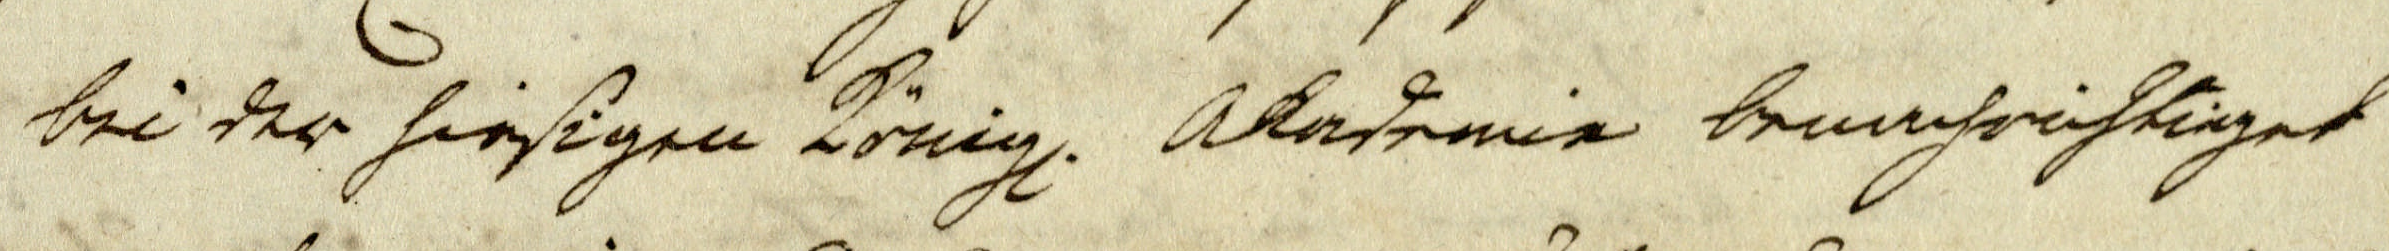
bei der hiesigen Königl. Akademie benachrichtiget
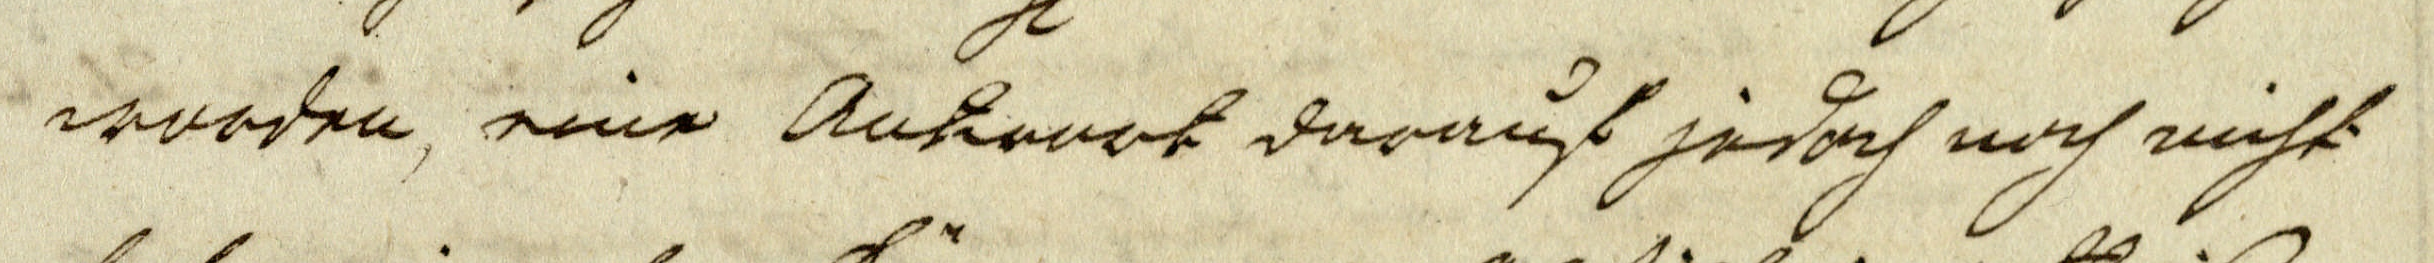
worden, eine Antwort darauf jedoch noch nicht
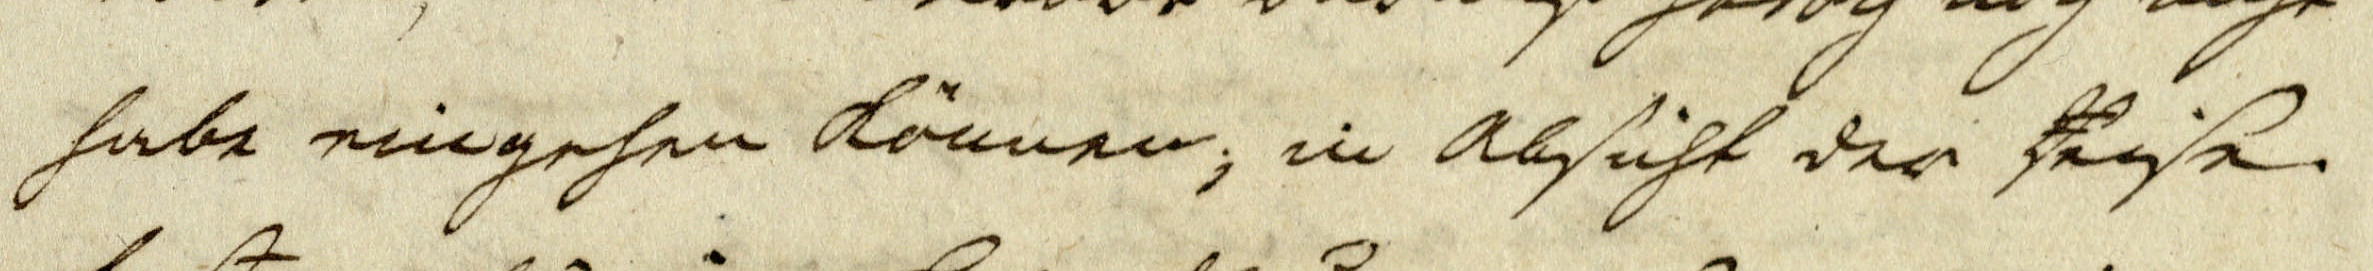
habe eingehen können, in Absicht der Reise¬
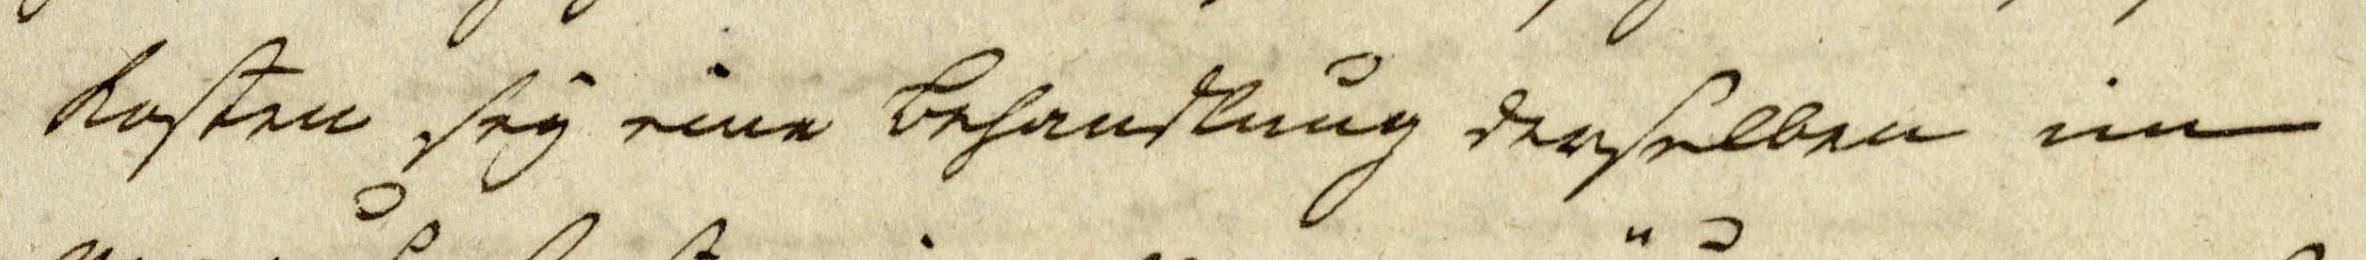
kosten seÿ eine Behandlung derselben im
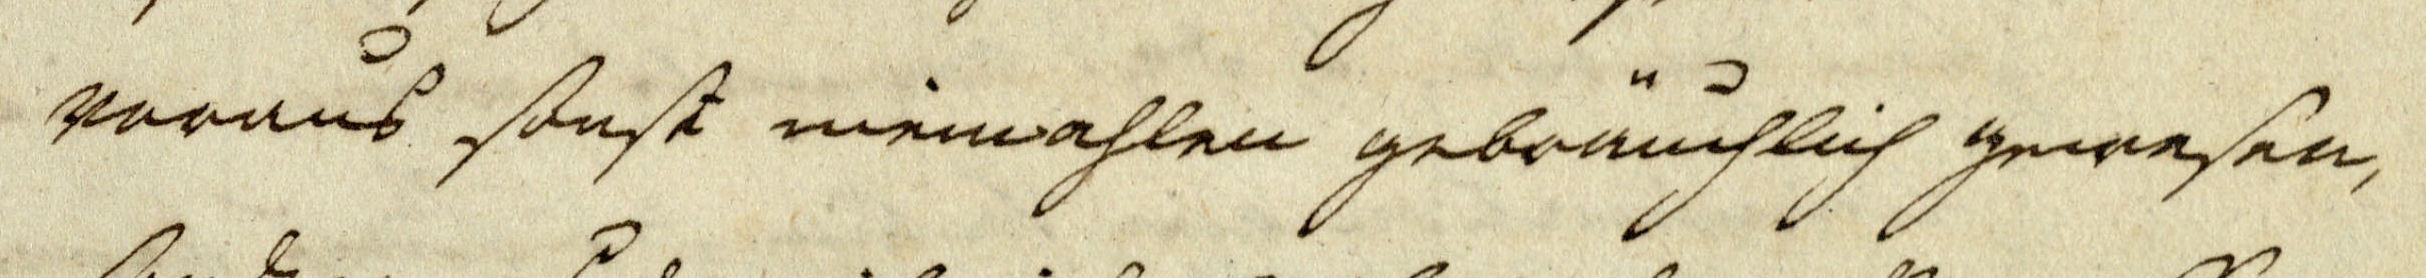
voraus sonst niemahlen gebräuchlich gewesen,
